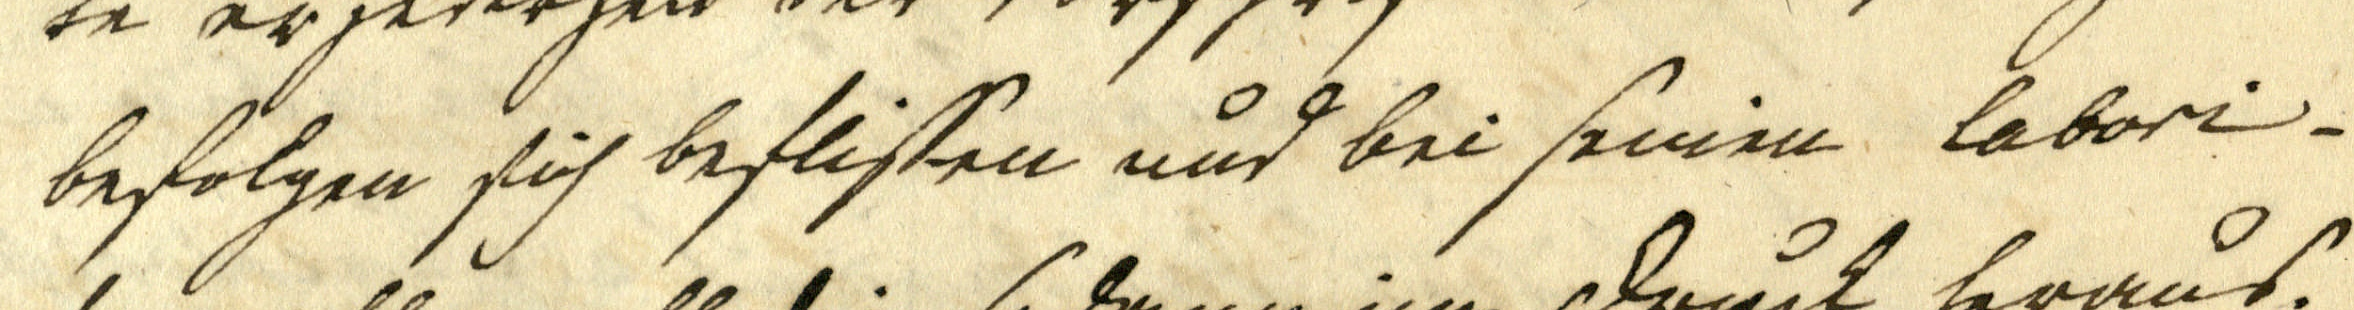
befolgen sich beflissen und bei seinen Labori¬
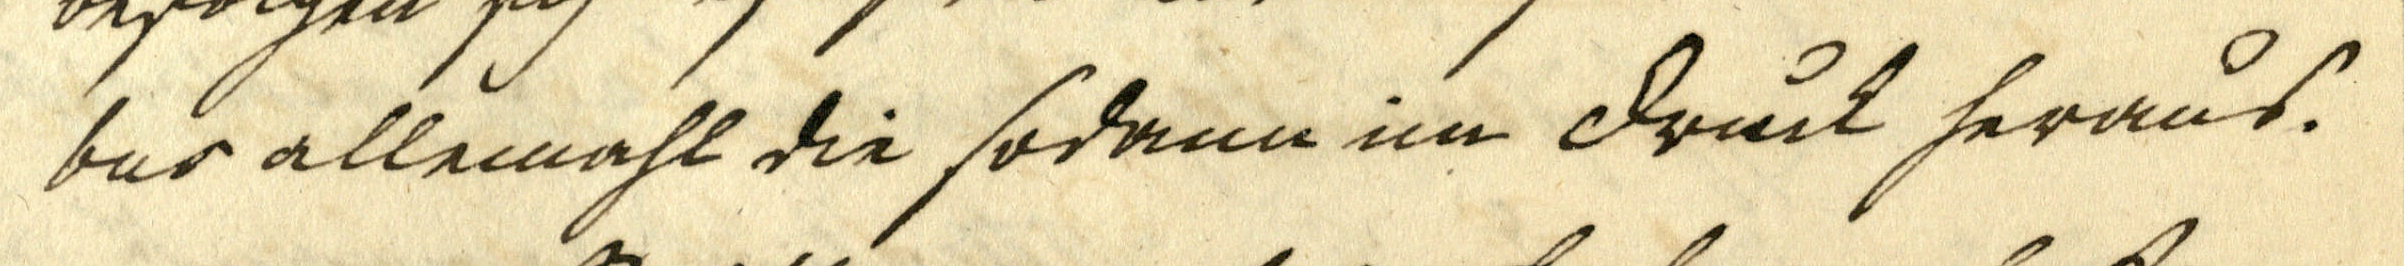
bus allemahl die sodann im Druck heraus¬
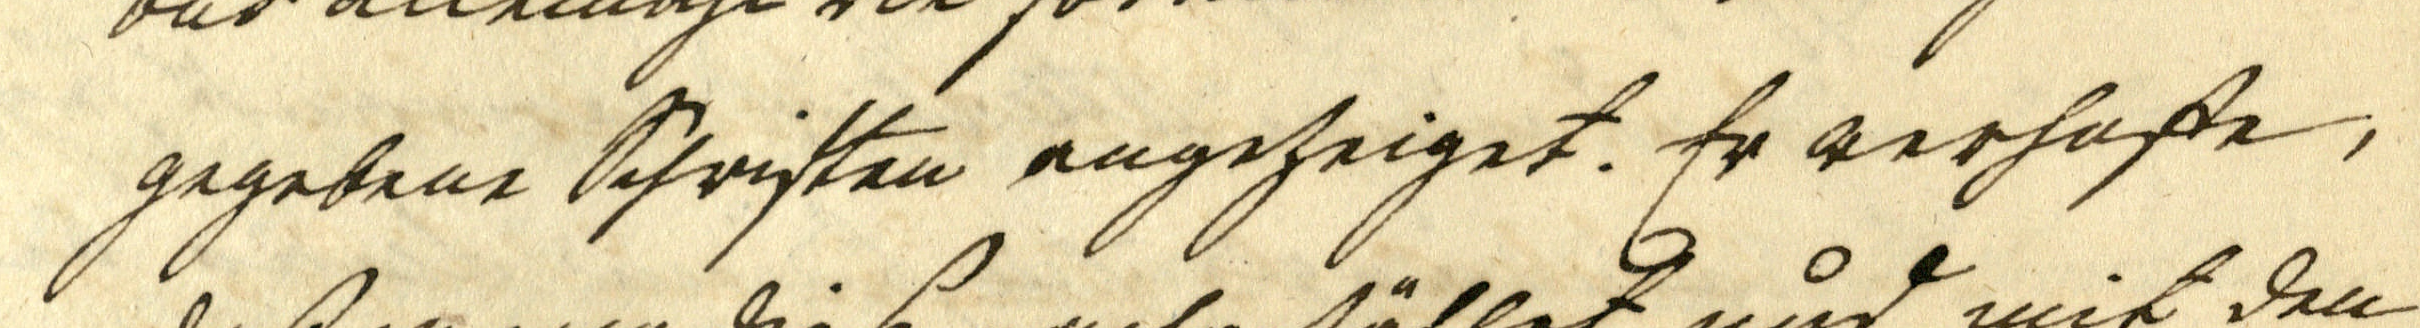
gegebenen Schriften angezeiget. Er verhoffe,
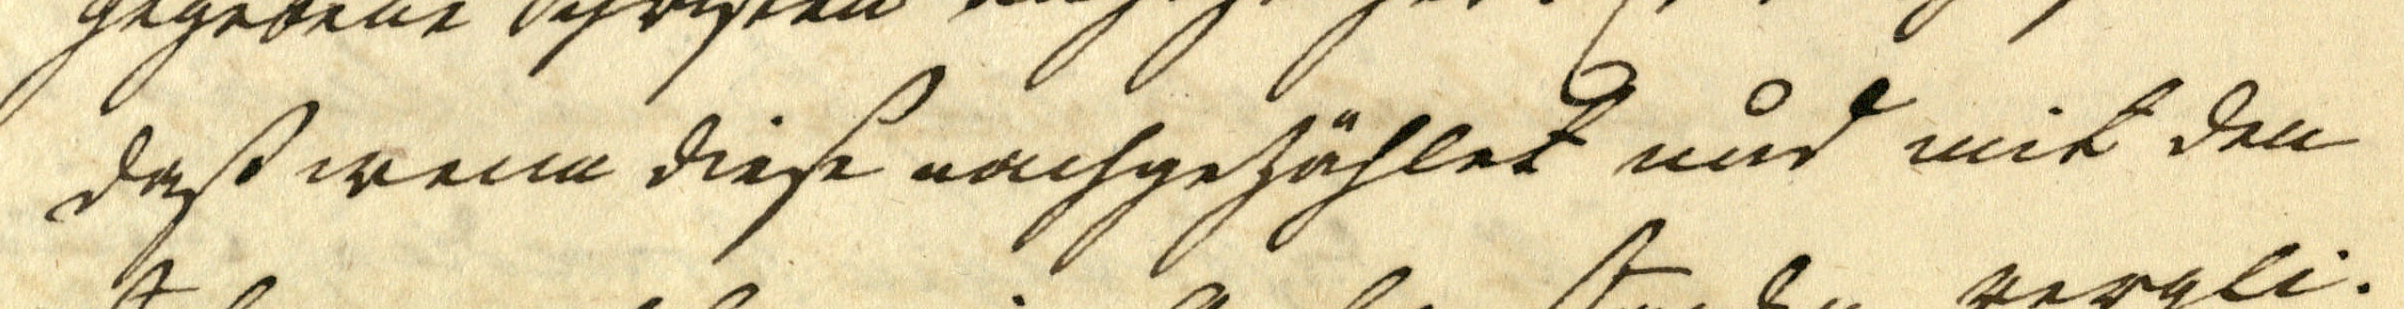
daß wenn diese nachgezählet und mit den
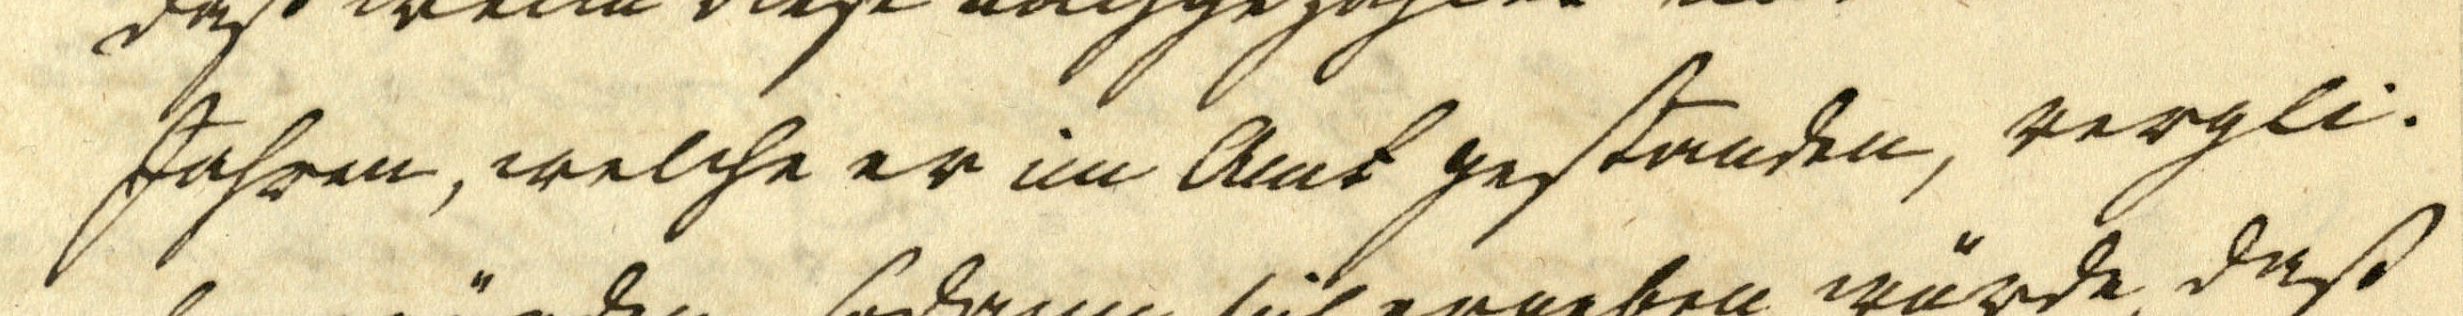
Jahren, welche er im Amt gestanden, vergli¬
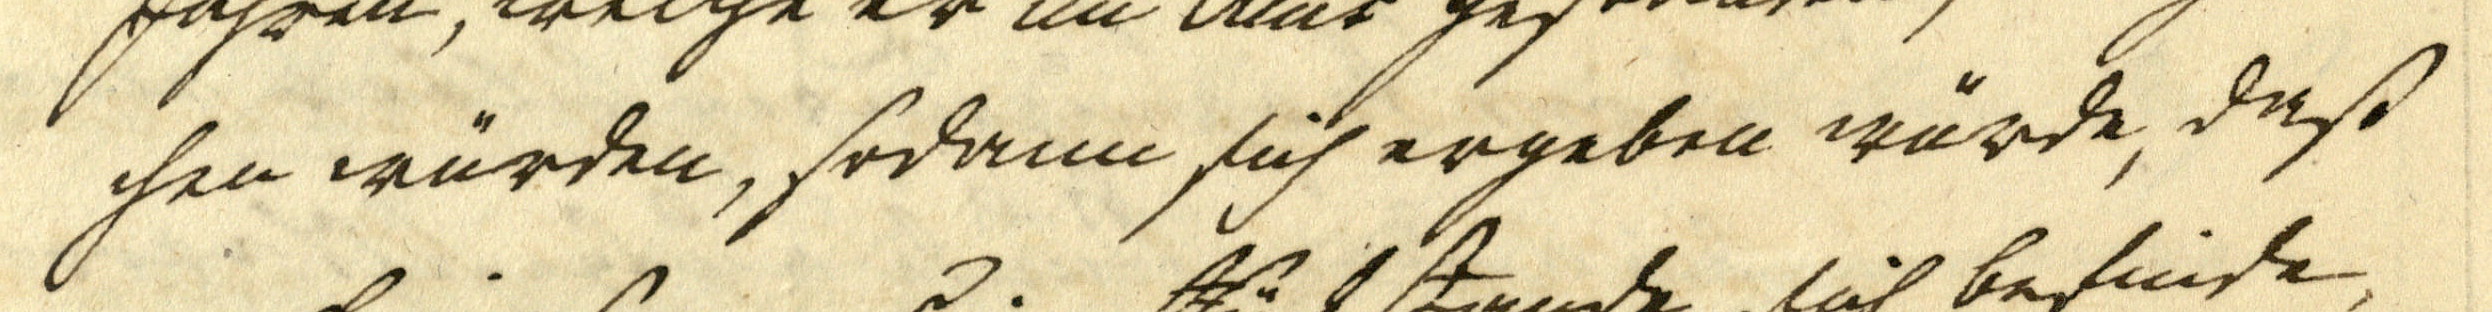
chen würden, sodann sich ergeben würde, daß
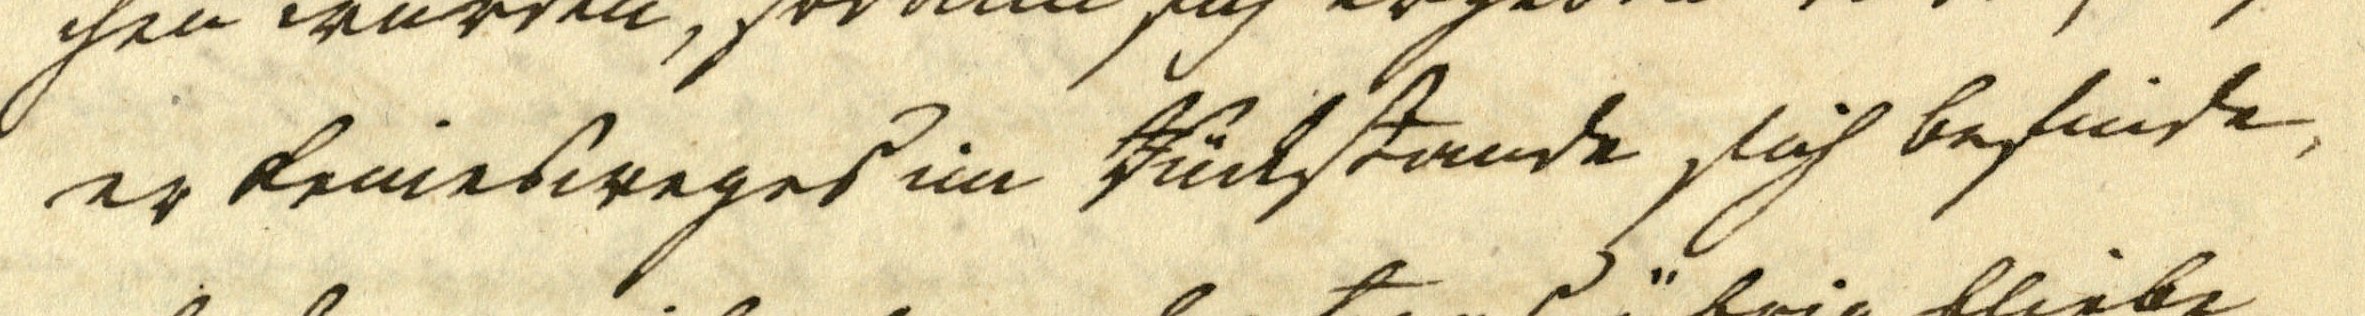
er keinesweges im Rückstande sich befinde,
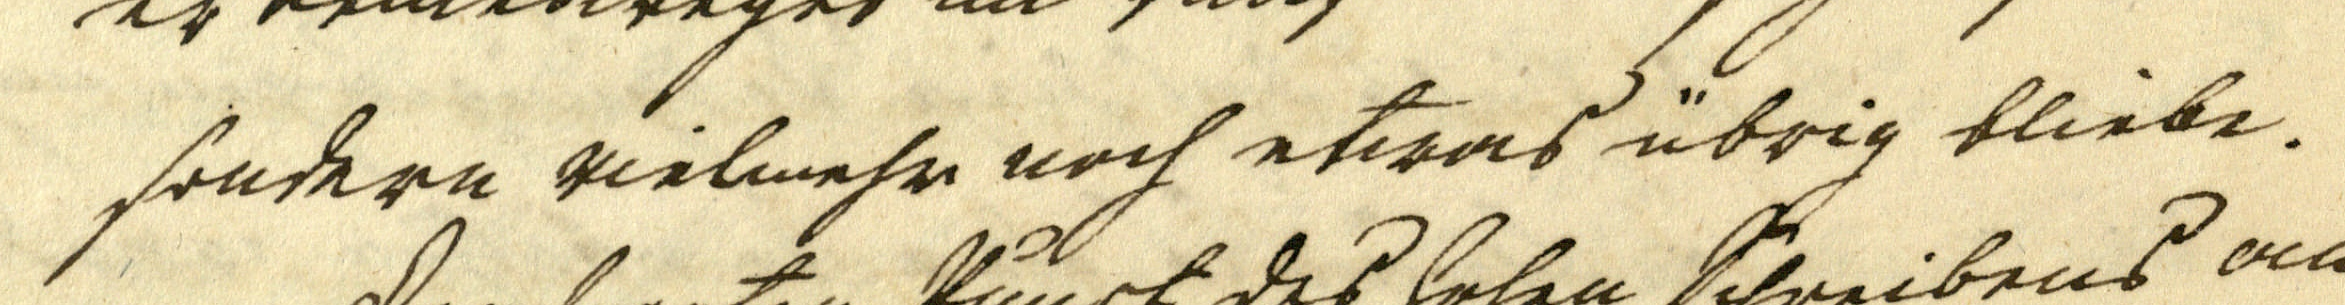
sondern vielmehr noch etwas übrig bliebe.
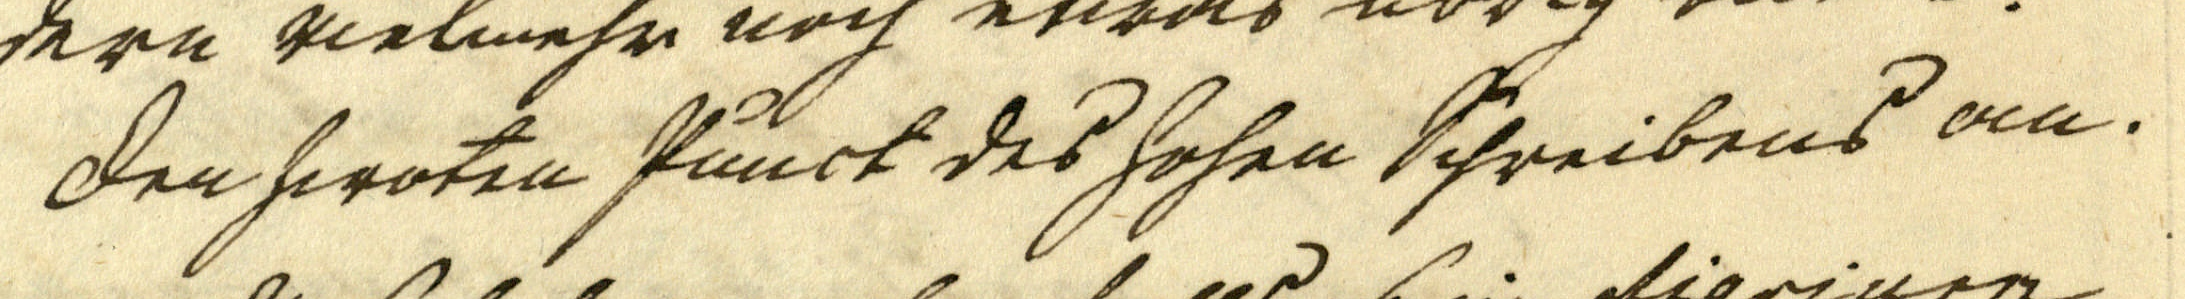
Den zwoten Punct des Hohen Schreibens an¬
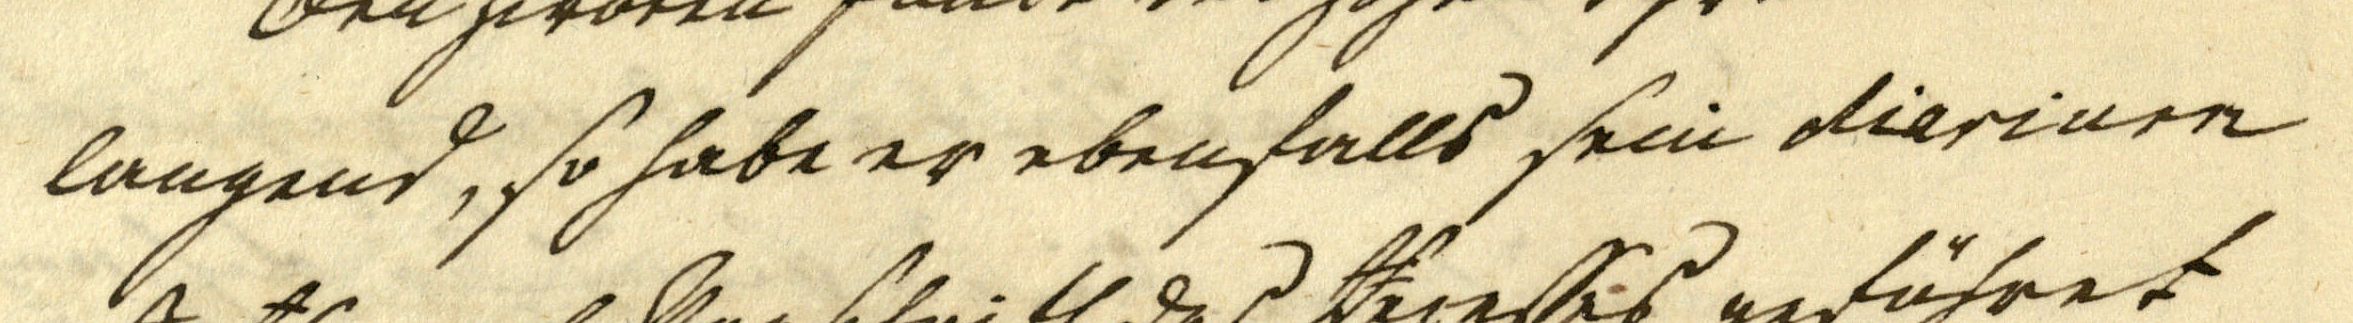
langend, so habe er ebenfalls sein diarium
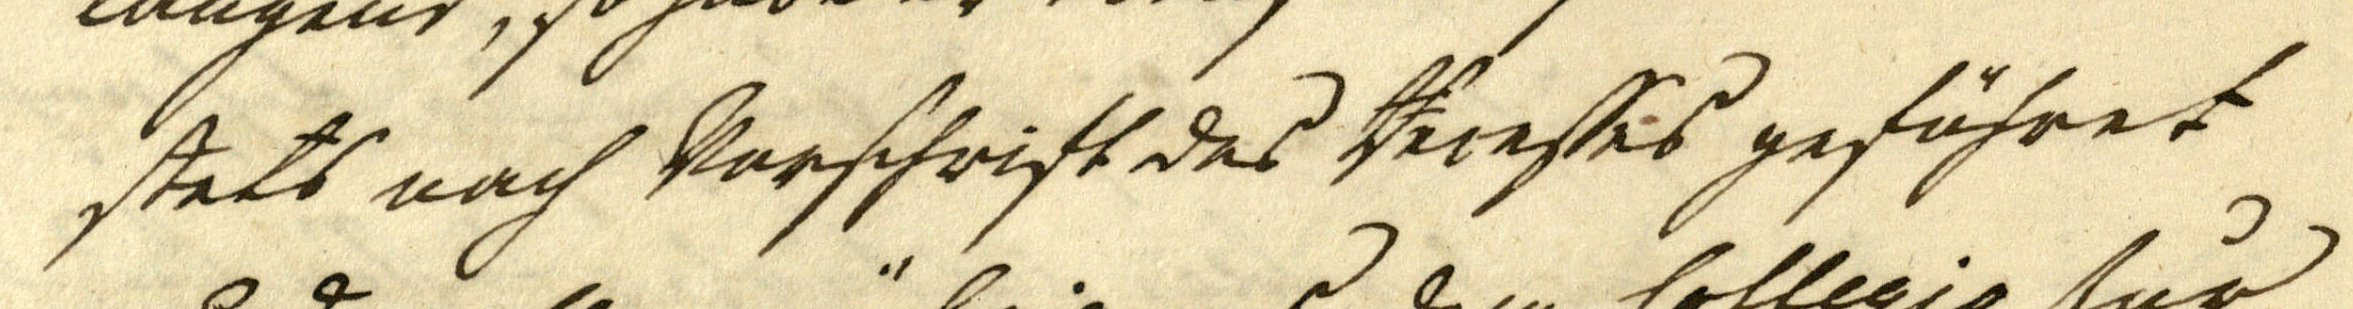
stets nach Vorschrift des Recesses geführet
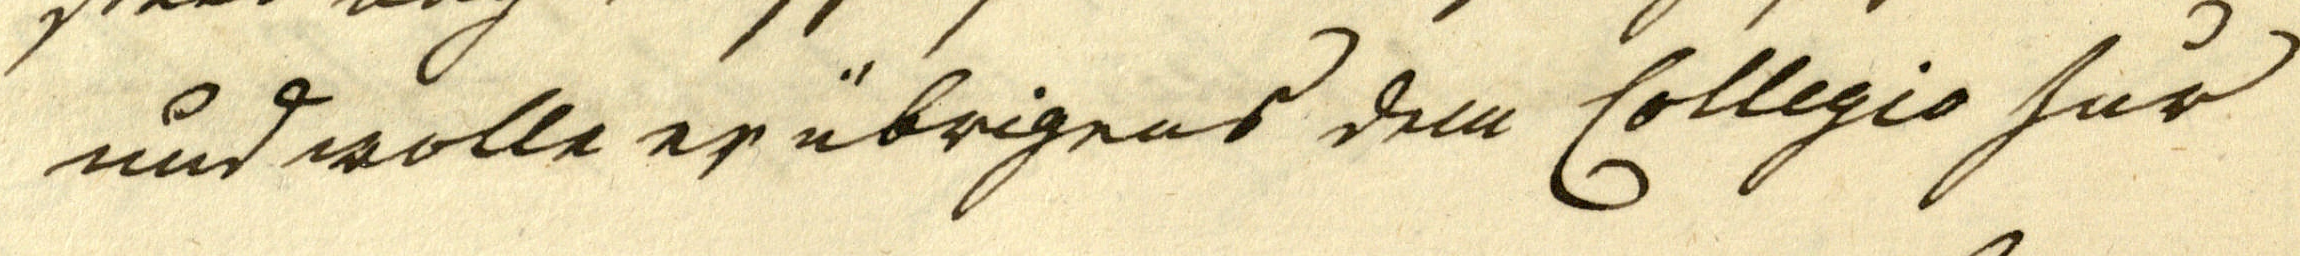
und wolle er übrigens dem Collegio zur
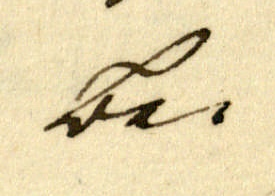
Be-
